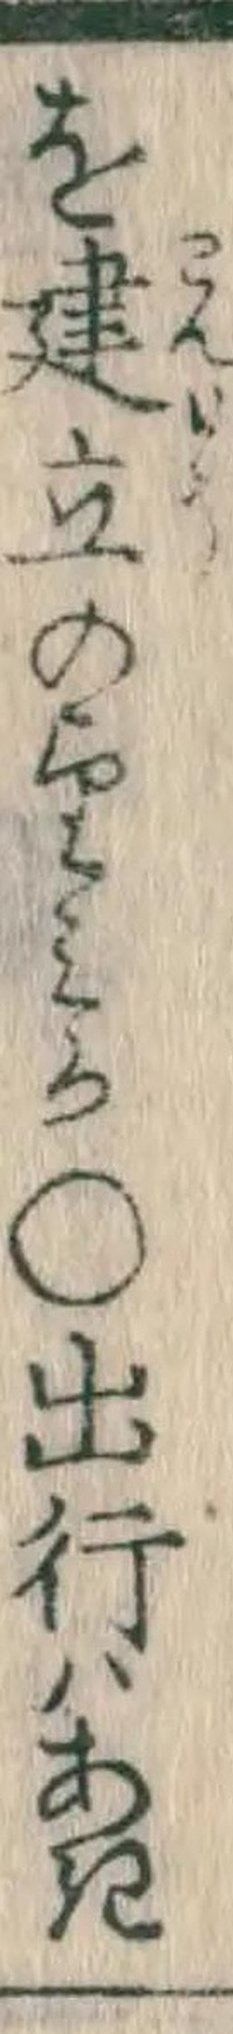を建立の望みか○出行はあき
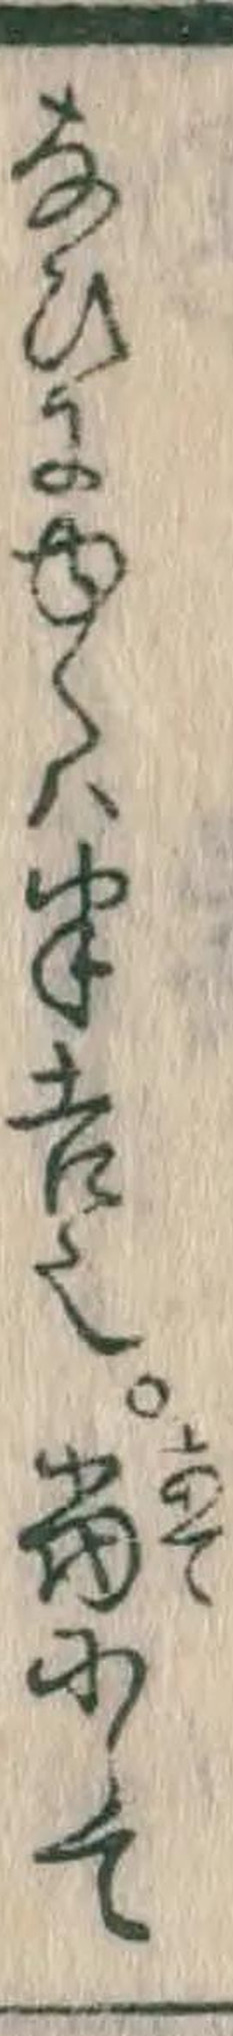なひにゆくは半吉也。当にして
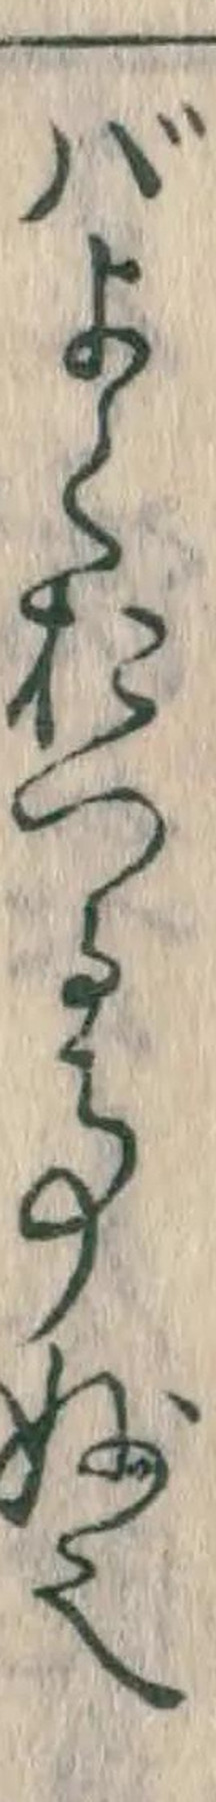ばよくおつる事妙也
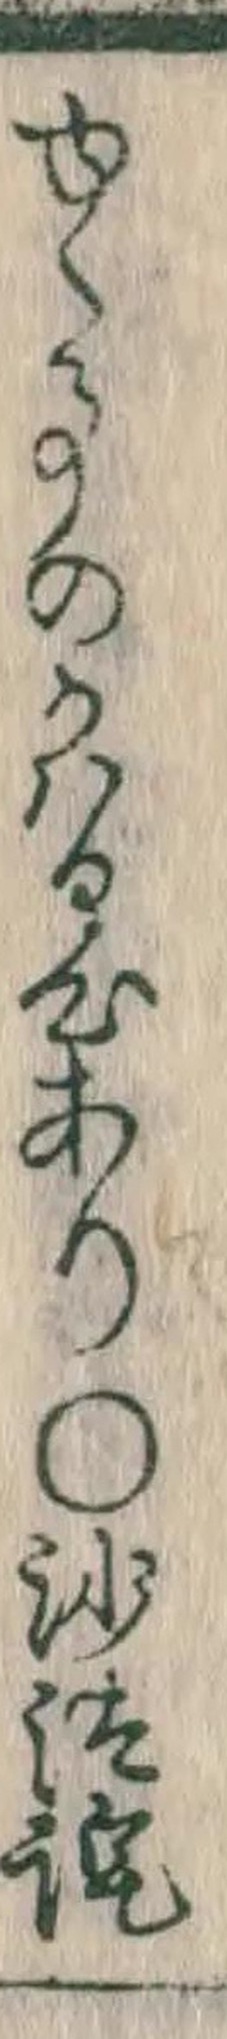ゆく事のかはる心あり○沙汰詫
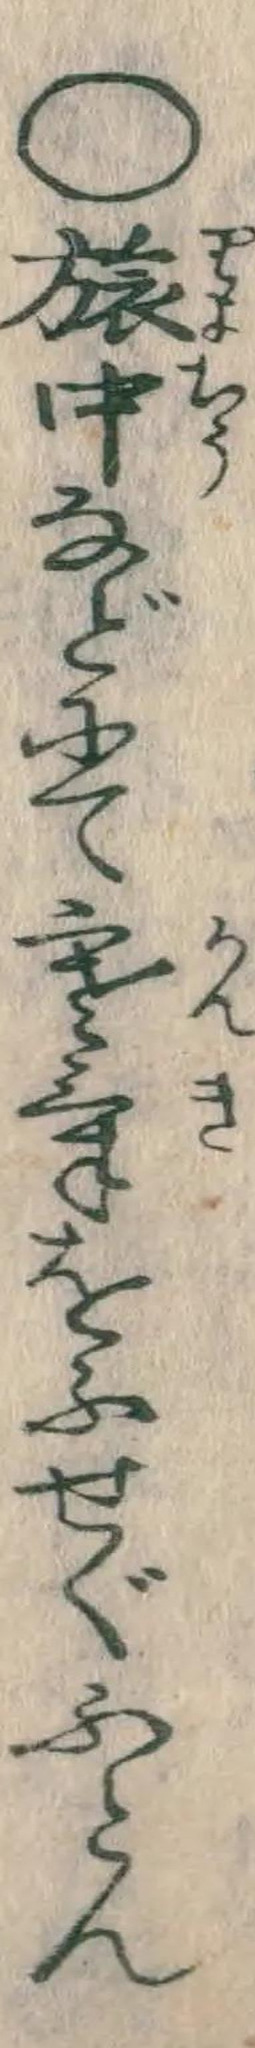○旅中などにて寒気をふせぐふとん
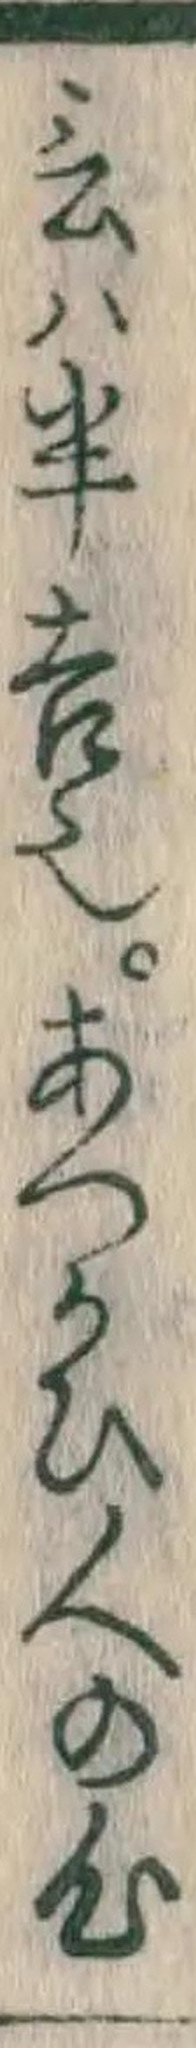言は半吉也。あつかひ人の心
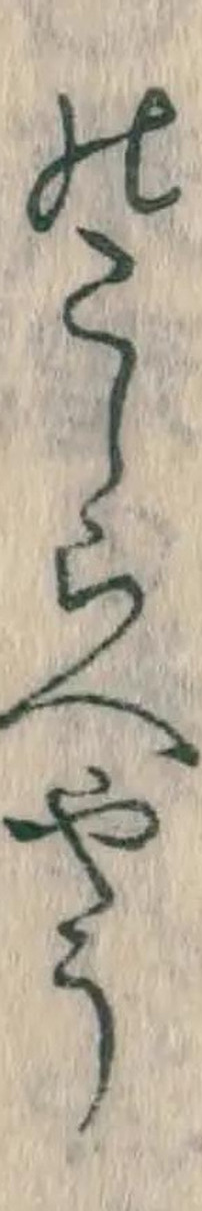のこしらへやう
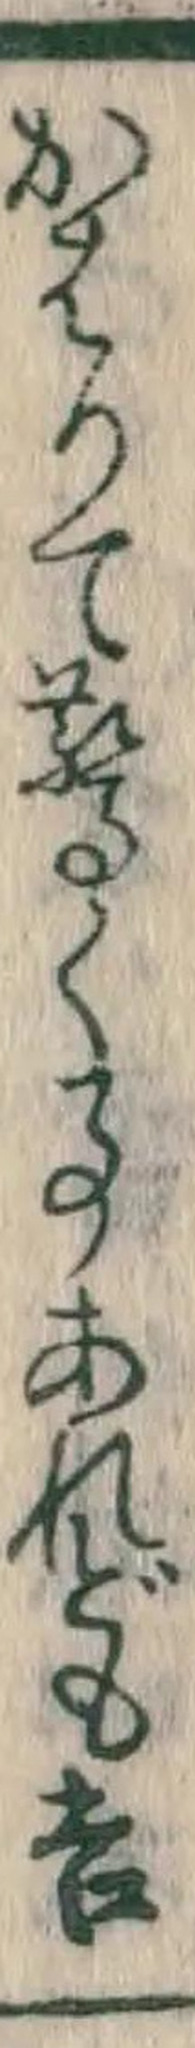かはりて驚く事あれども吉
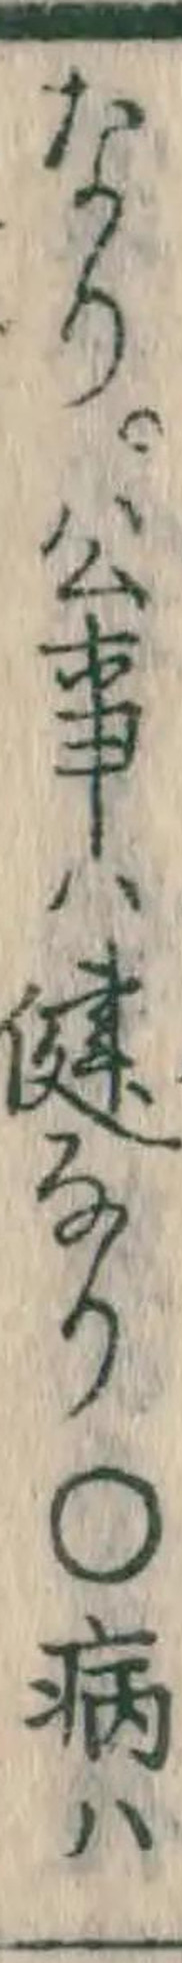なり。公事は健なり○病は
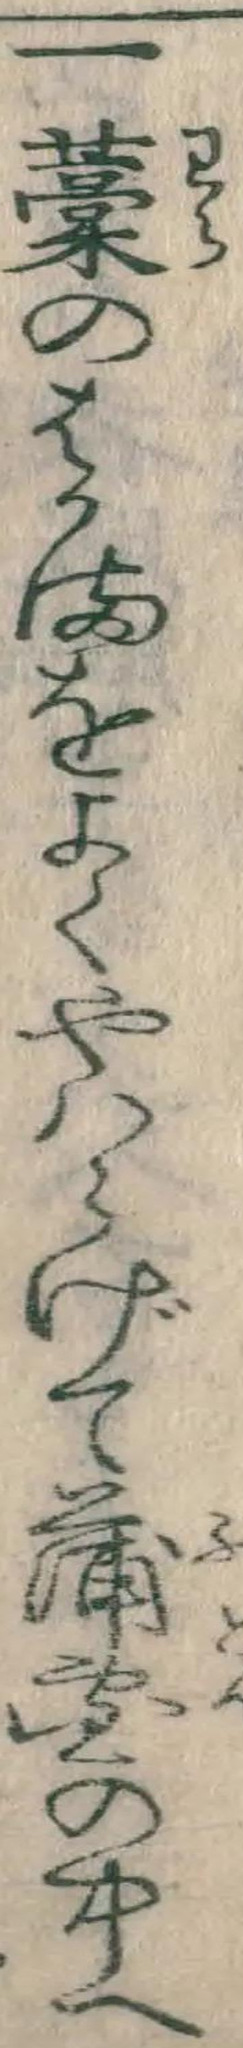一藁のはかまをよくやはらげて蒲団の中へ
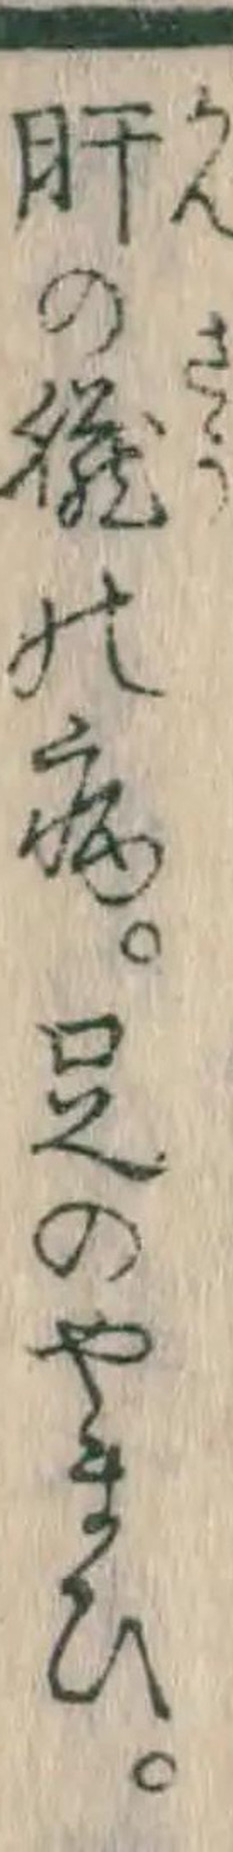肝の臓の病。足のやまひ。
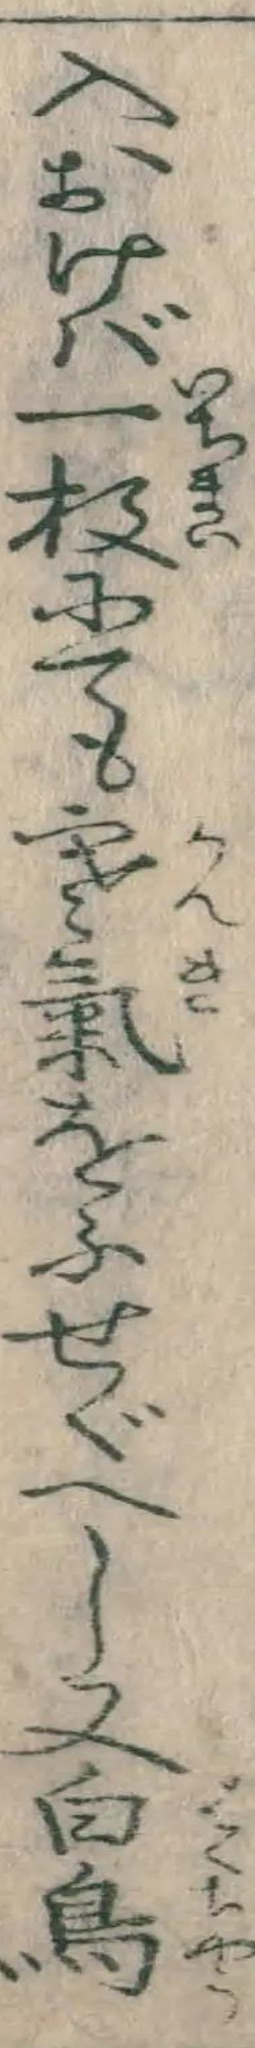入おけば一枚にても寒気をふせぐへし又白鳥

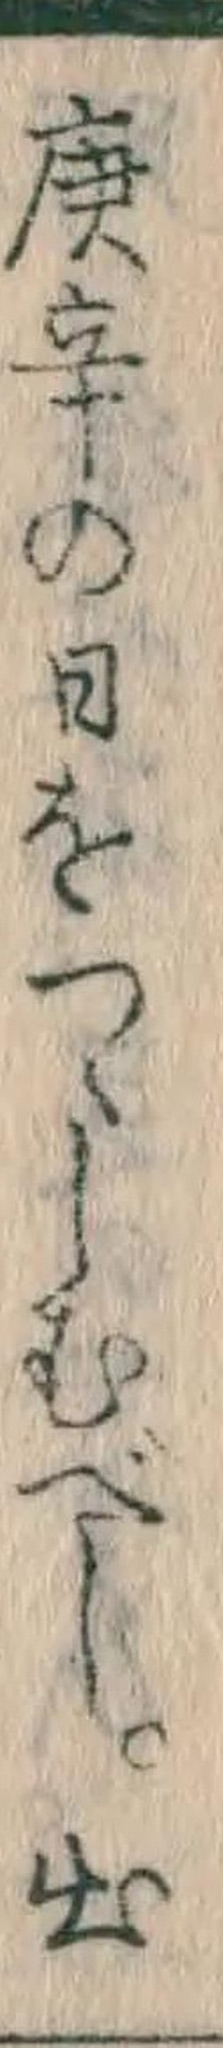庚辛の日をつゝしむべし。出
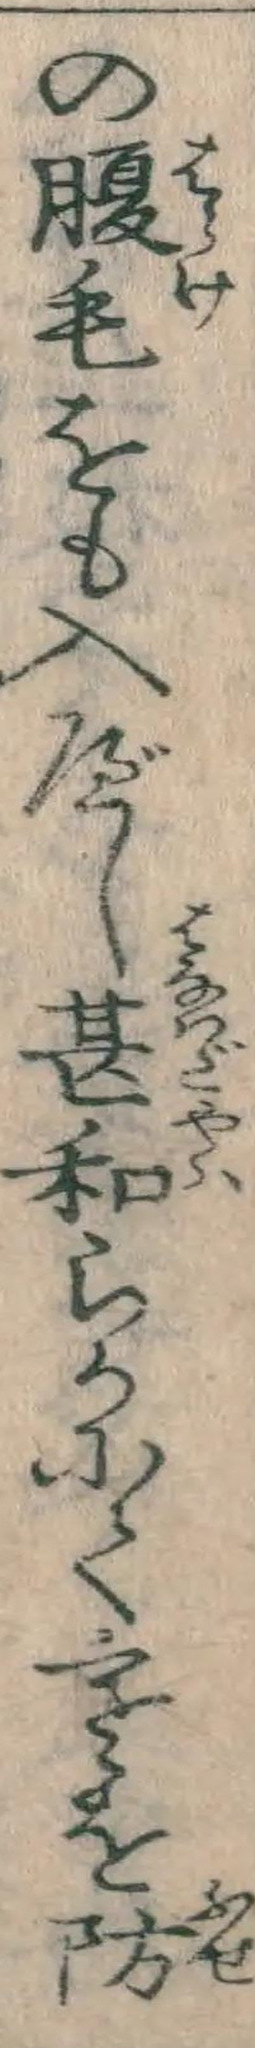の腹毛をも入べし甚和らかにて寒を防
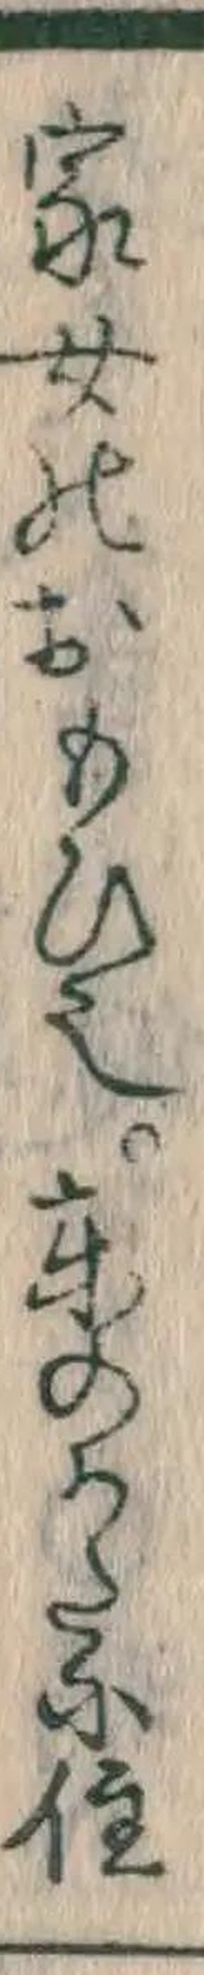家女のおもひ也。東のかたに住
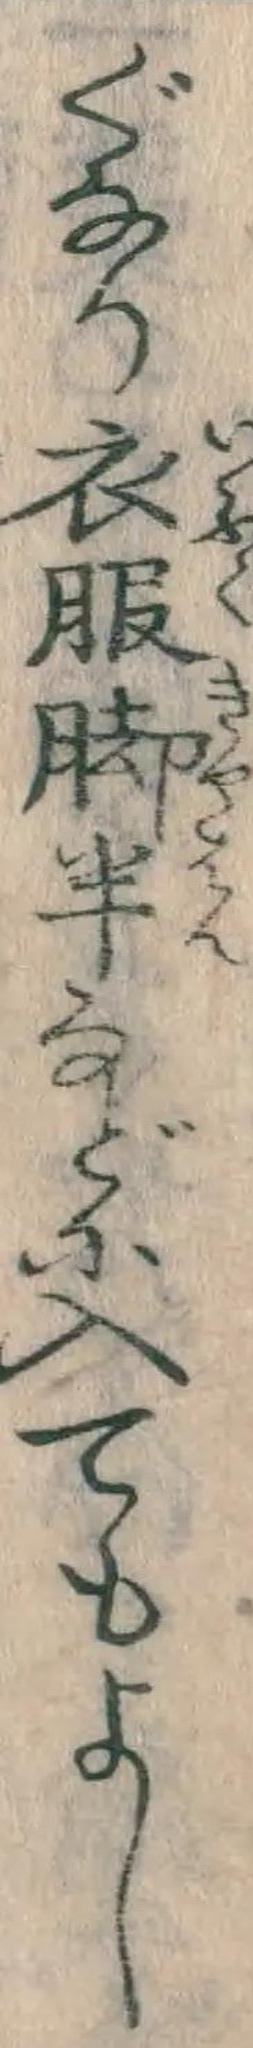ぐなり衣服脚半などに入てもよし
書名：広益秘事大全 3巻. [1]
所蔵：国立国会図書館 National Diet Library, JAPAN
